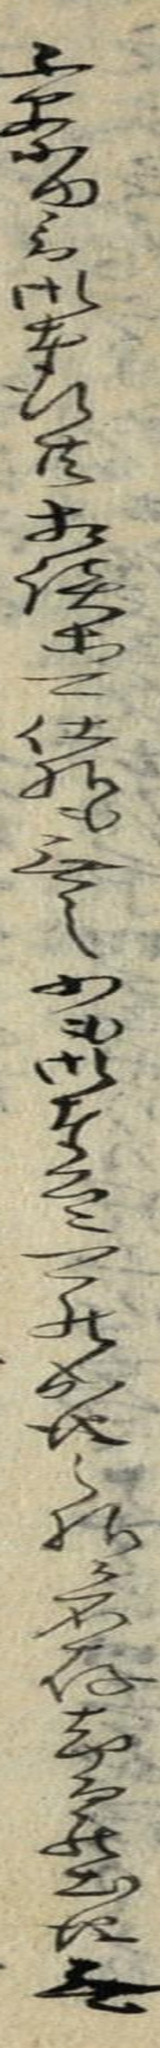不案内に而御奉行共相談等可仕様も無之処右少も御奉公に可罷成儀之様に不存却而罷出候儀無
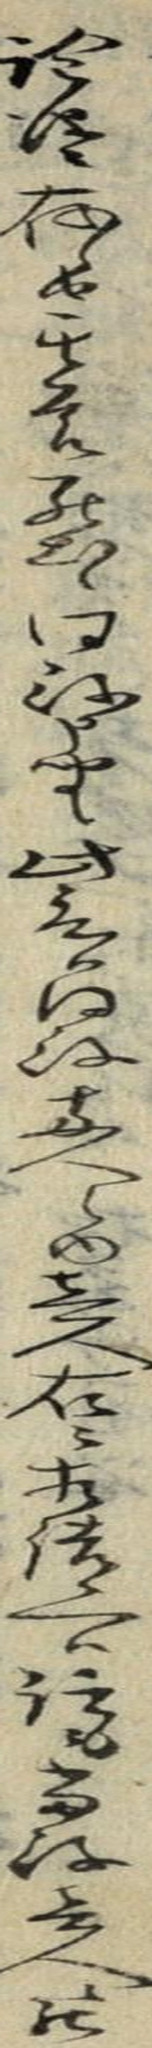詮儀に存候由其節罷出候同役申聞此度は同役両人之内壱人右に相詰候へは跡も当役壱人に被
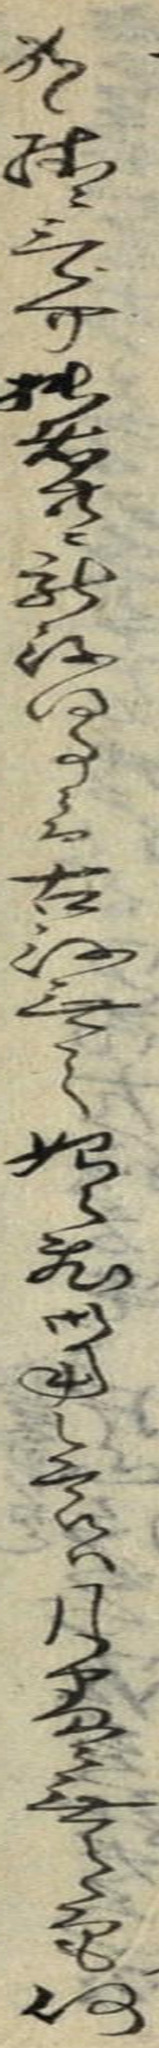成候殊に三之介拙者共に新役同事に而古役無之妬し敷御用之節は月番に無之候而も何
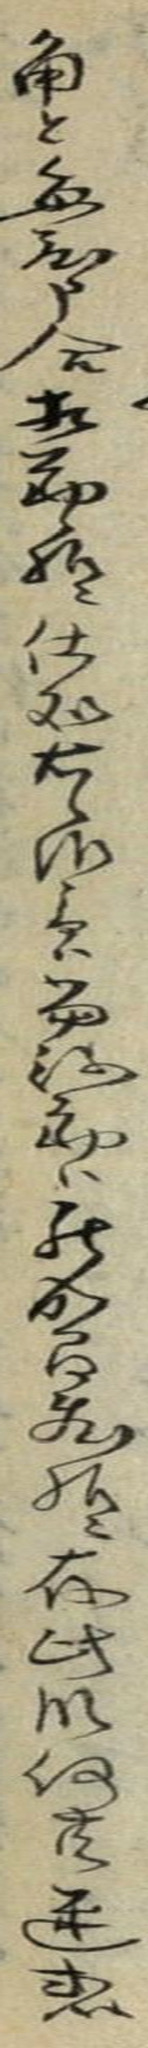角と毎度申合相勤候様に仕候処右之様に而は当役勤は罷成間敷様に存此段何共迷惑
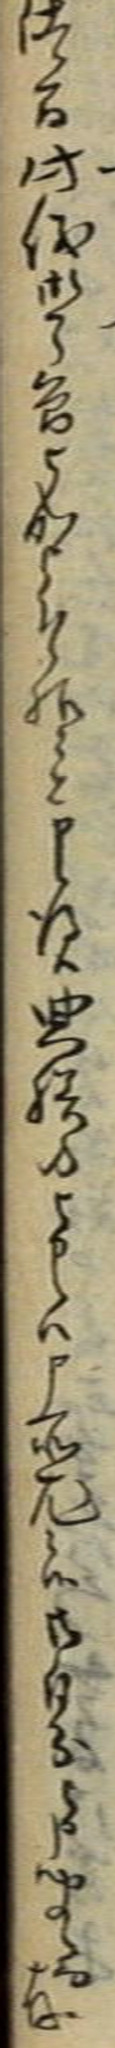仕候間此儀御了簡被成被下候様にと申候得は典膳方被申候は申承尤に候御自分申聞候而存
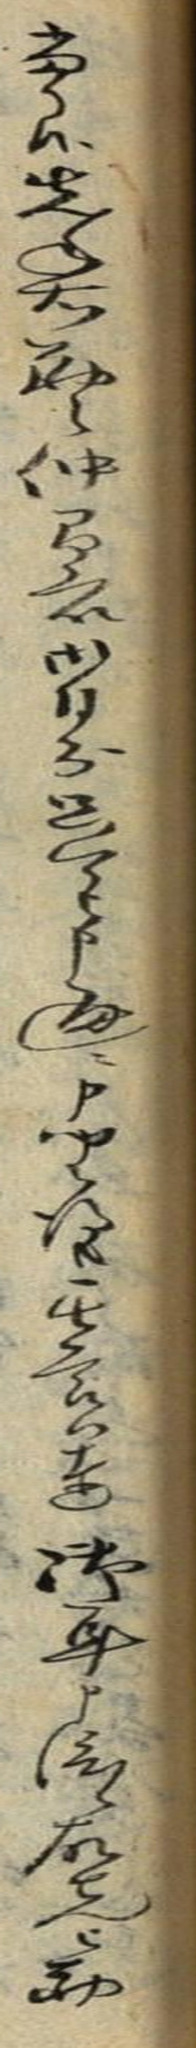当り候先年右勤之仲間衆御自分只今被申通に申聞候得共其節は達御耳申渡候故先被勤
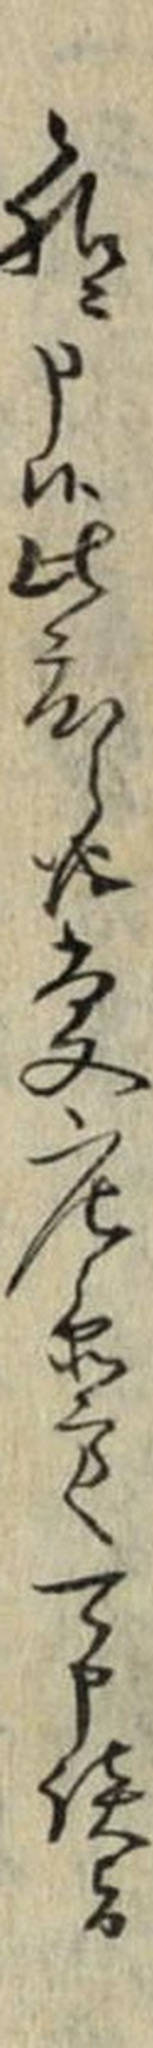候様に申候此度之儀尚又庄兵衛方へ可申談旨
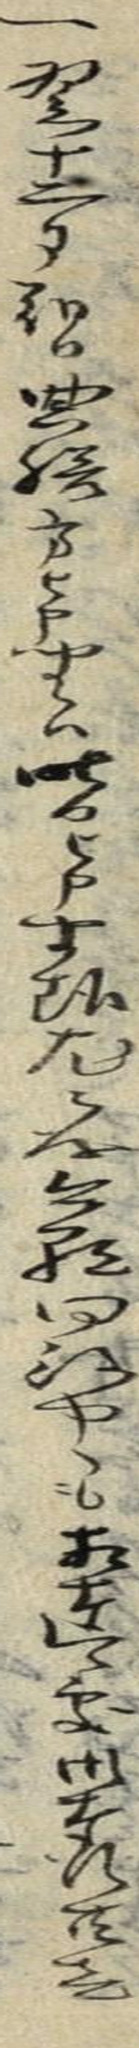一翌十二月朔日典膳方被申聞候は昨日被申聞候趣尤に存今朝同役中へも相達候処御奉行共壱
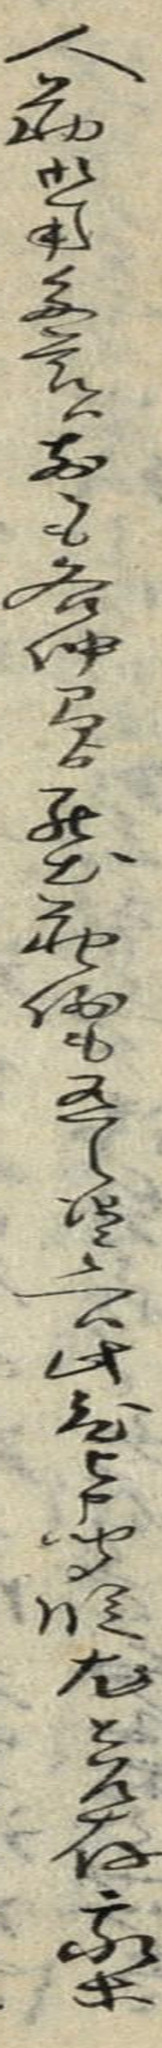人勤御用多節は前にも各仲間ゟ罷出勤候例も有之儀に候へは此度被申聞候段尤と乍存我等
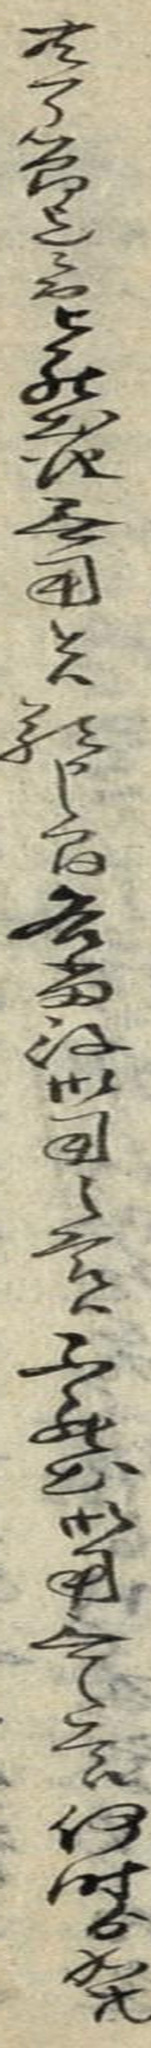共了簡迄に而被罷出候儀無用とは難申候間各当役御用之節は不罷出御用無之節何時ゟ成共
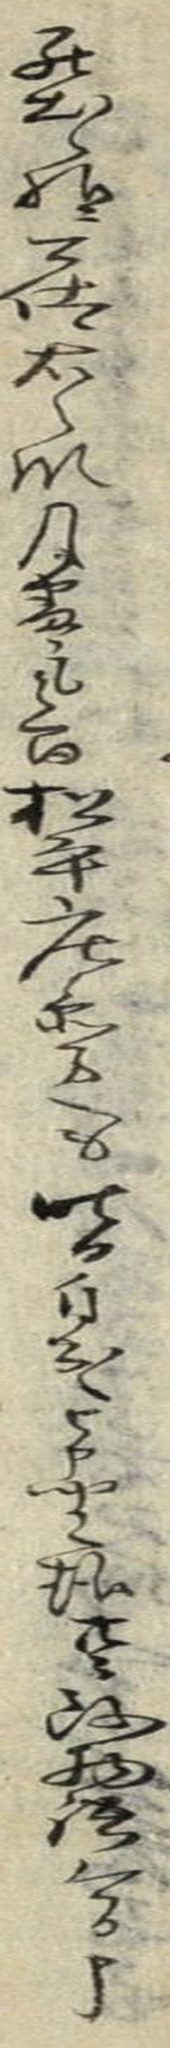罷出候様可仕候右之段月番にも候間松平庄兵衛方へも昨日自分へ被申聞候趣共々致物語今日申
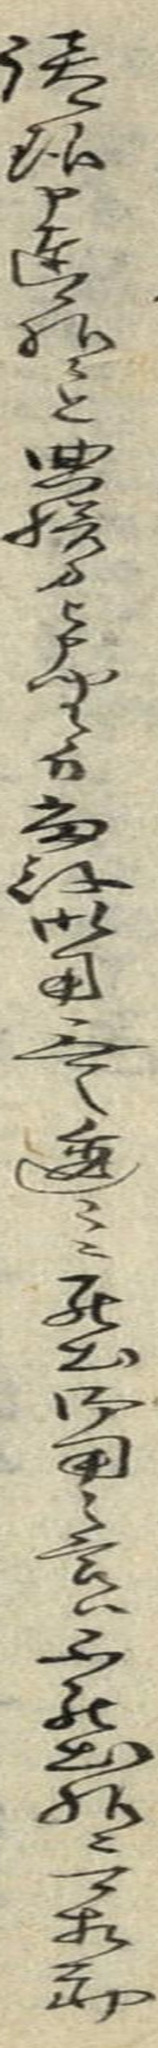談候趣申達候様にと典膳方被申聞候に付当役御用無之違々に罷出御用之節は不罷出候様に可相勤
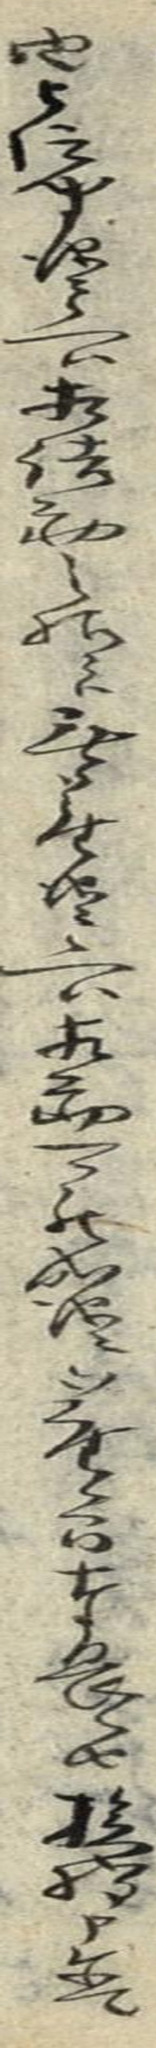由に被仰出儀に候へは相詰勤之候様には無御座候へは相勤可罷成儀に御座候間奉畏候由挨拶申置候
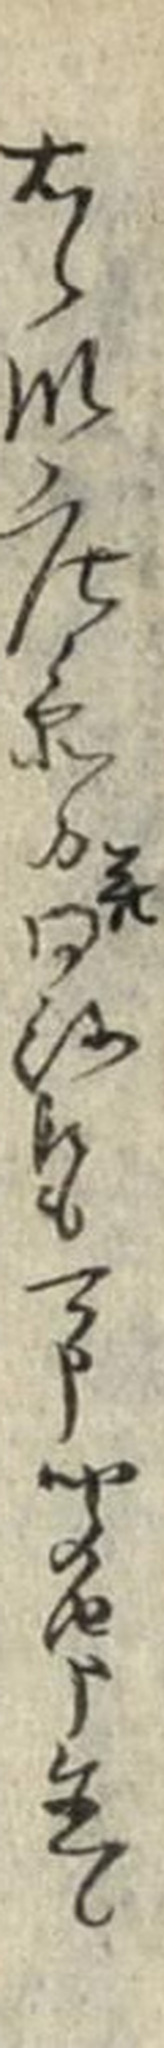右之段庄兵衛方并同役江も可申聞由申置候
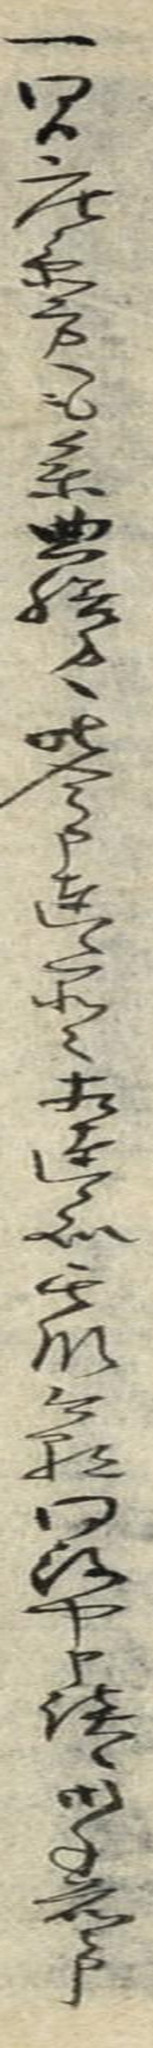一同日庄兵衛方へも被参典膳方へ唯今申達候品々相達候処其段今朝同役中申談候御手前被申
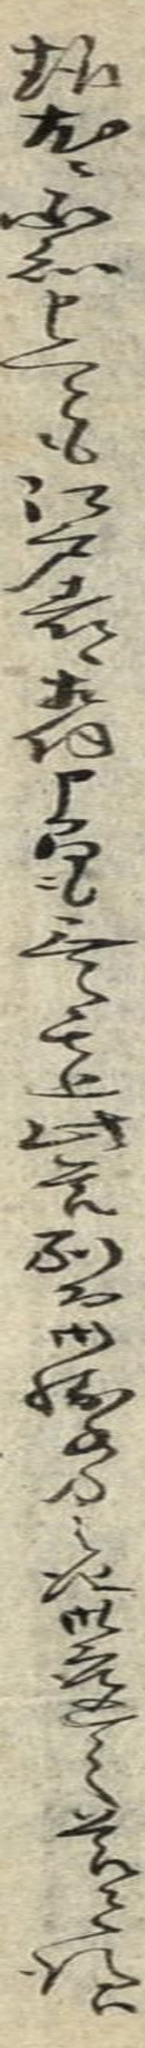趣尤に承知申候へとも江戸表へ相伺申間も無之其上此節別而御勝手方之儀御取込之節に候得は
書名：蒐輯之部
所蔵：福井県文書館 Fukui Prefectural Archives
